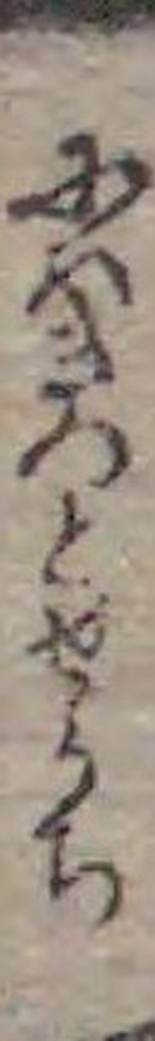にはきつとせうち
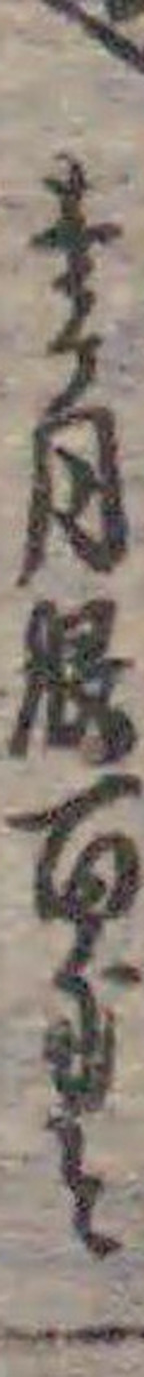壱ケ月銀百匁と
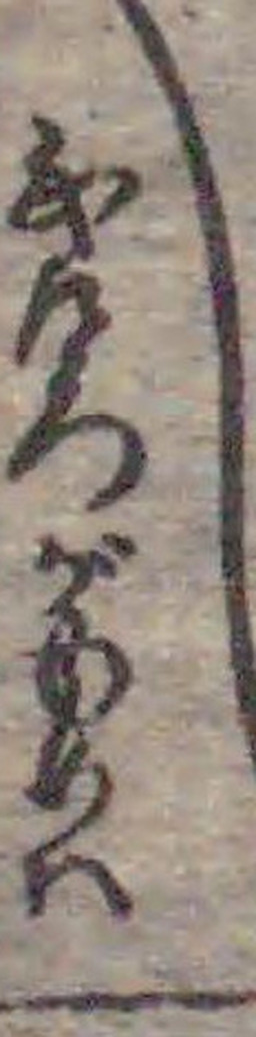武左衛門がゆめは
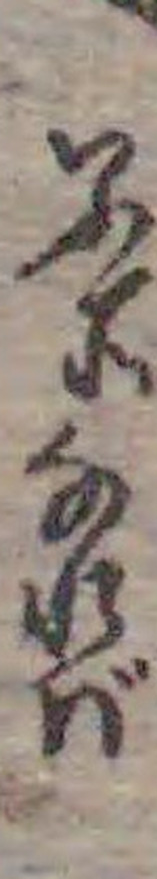いふ所なれば
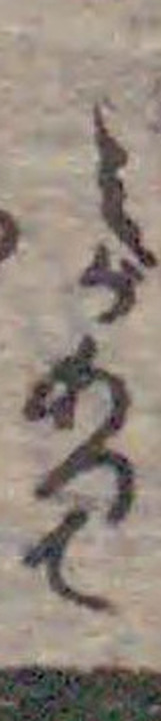みがあつて
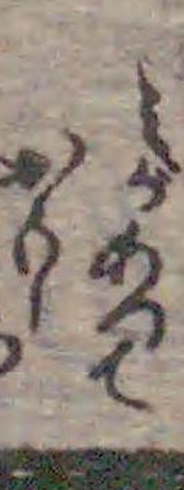おもしろ
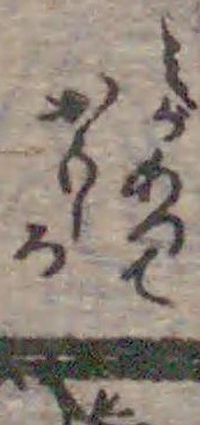おもしろ

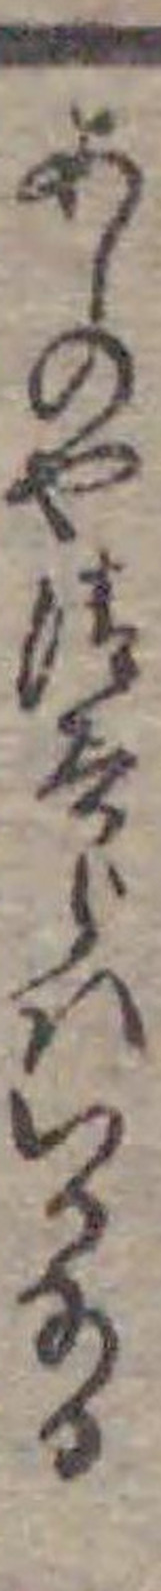あしのや清太郎はいかなる
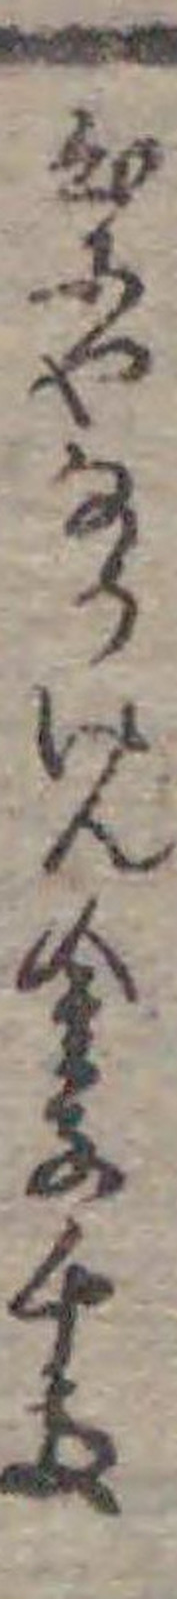心にやなりけん金子千両
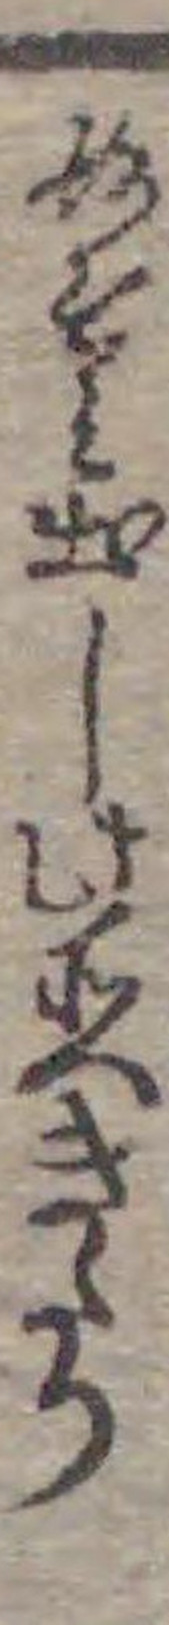ぬすみ出し此処へきたり
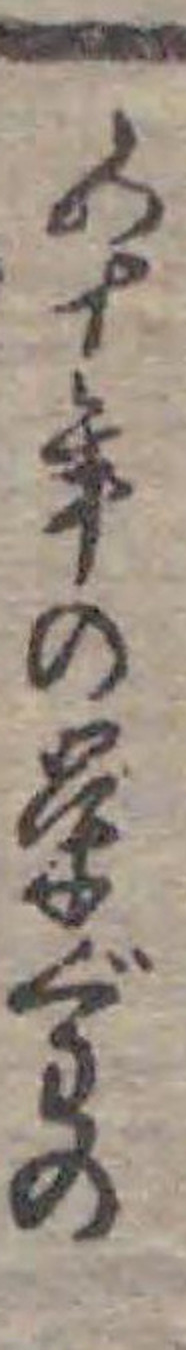五十年の栄ぐわの
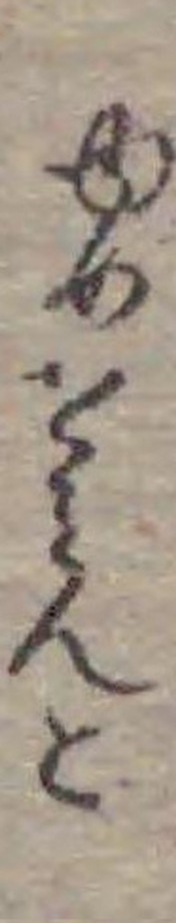ゆめをみんと
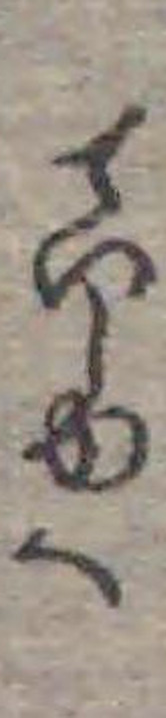ていしゆへ
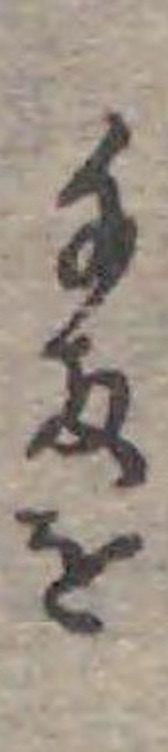千両を
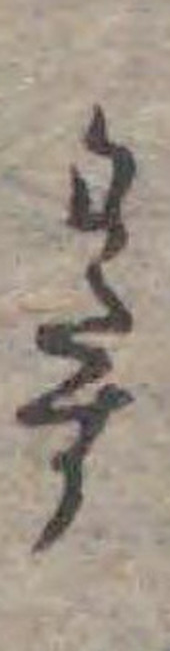わたす
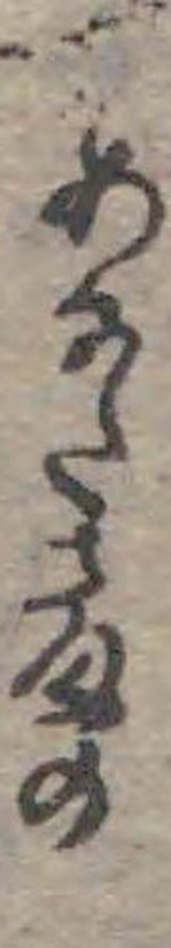あなたさまの
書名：見徳一炊夢 : 3巻
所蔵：国立国会図書館 National Diet Library, JAPAN
